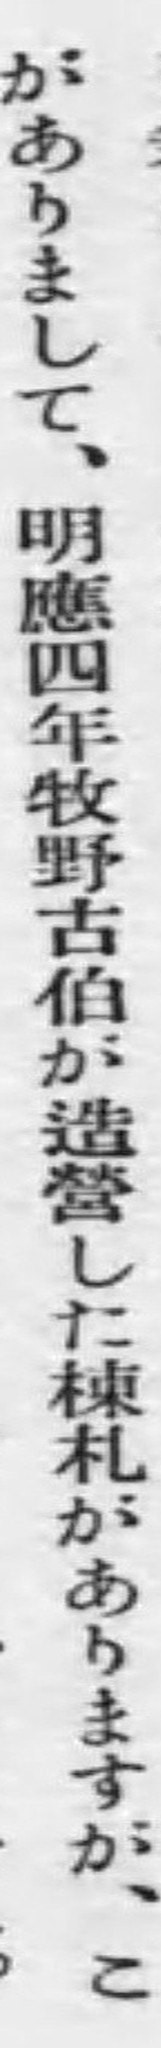がありまして、明応四年牧野古伯が造営した棟札がありますが、こ
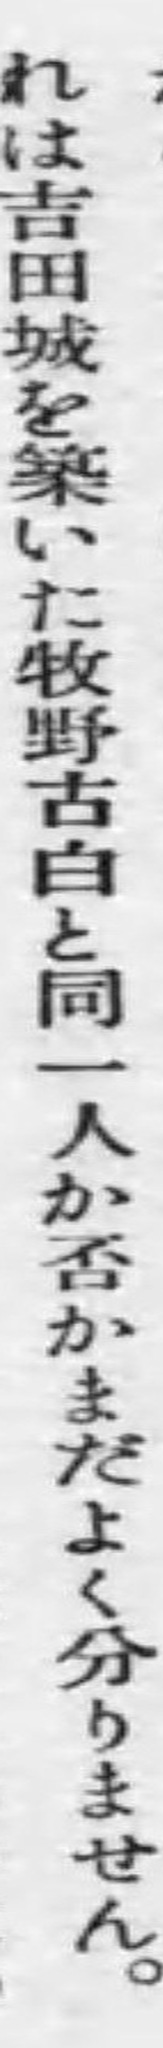れは吉田城を築いた牧野古白と同一人か否かまだよく分りません。
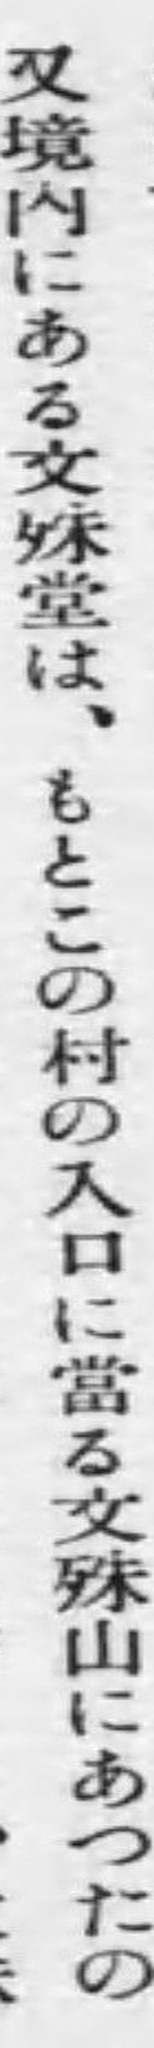又境内にある文殊堂は、もとこの村の入口に当る文殊山にあつたの
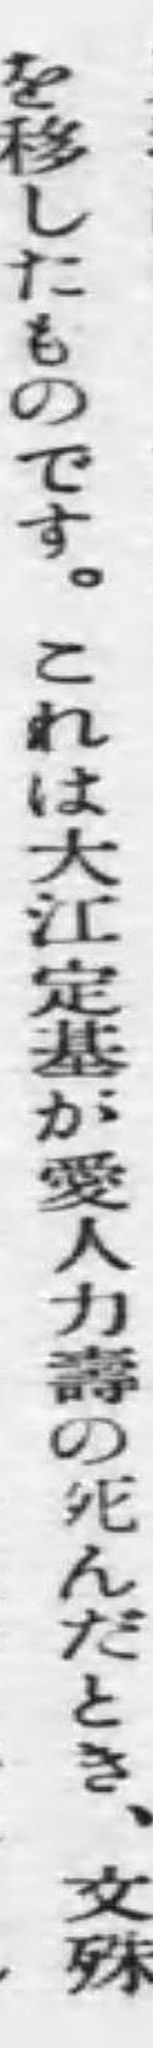を移したものです。これは大江定基が愛人力寿の死んだとき、文殊
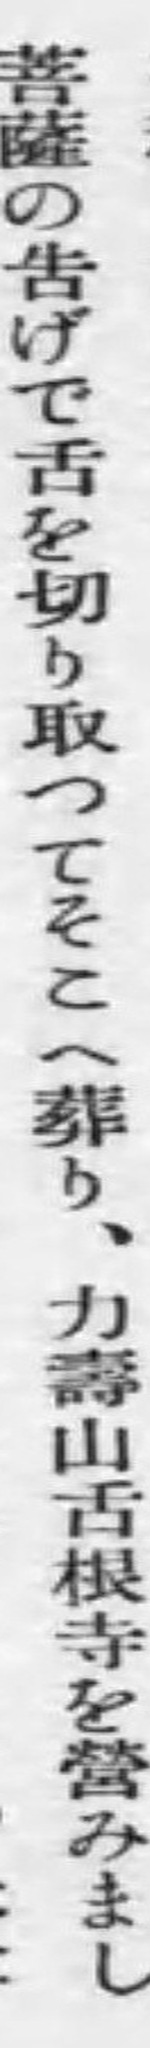菩薩の告げで舌を切り取つてそこへ葬り、力寿山舌根寺を営みまし
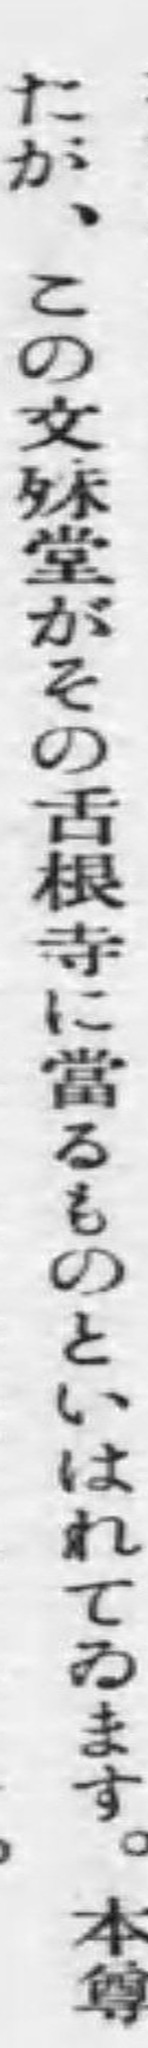たが、この文殊堂がその舌根寺に当るものといはれてゐます。本尊
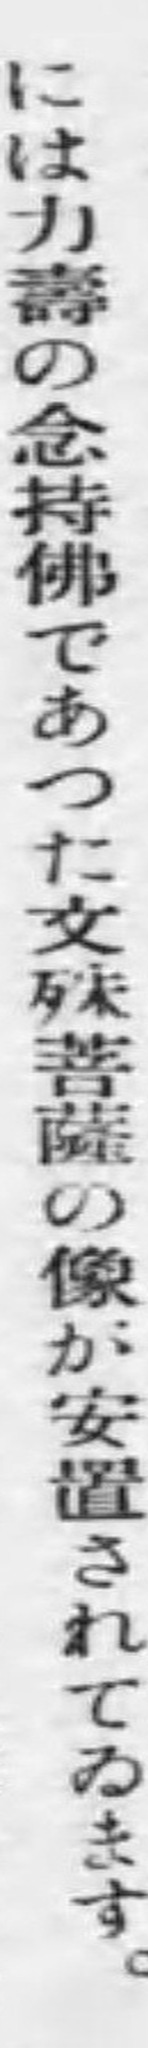には力寿の念持仏であつた文殊菩薩の像が安置されてゐます。
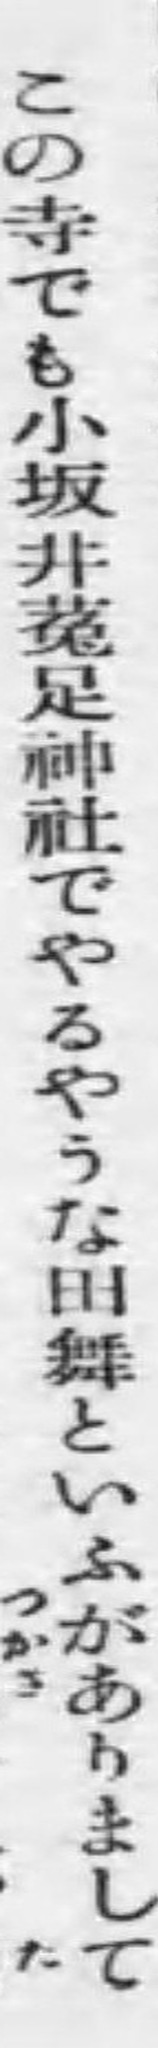この寺でも小坂井菟足神社でやるやうな田舞といふがありまして
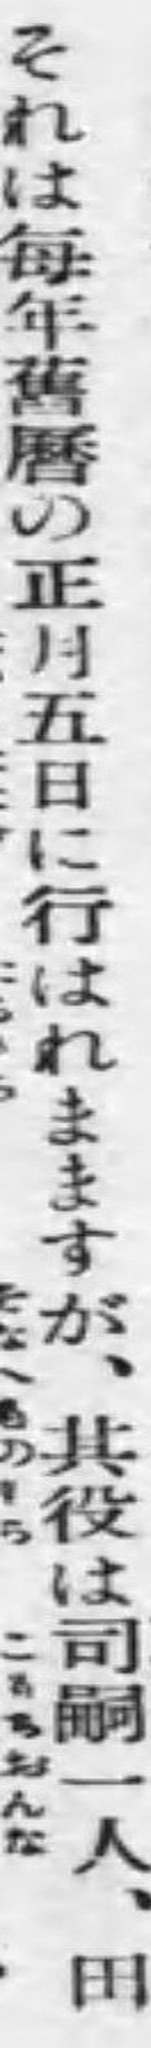それは毎年旧暦の正月五日に行はれまますが、其役は司嗣一人、田
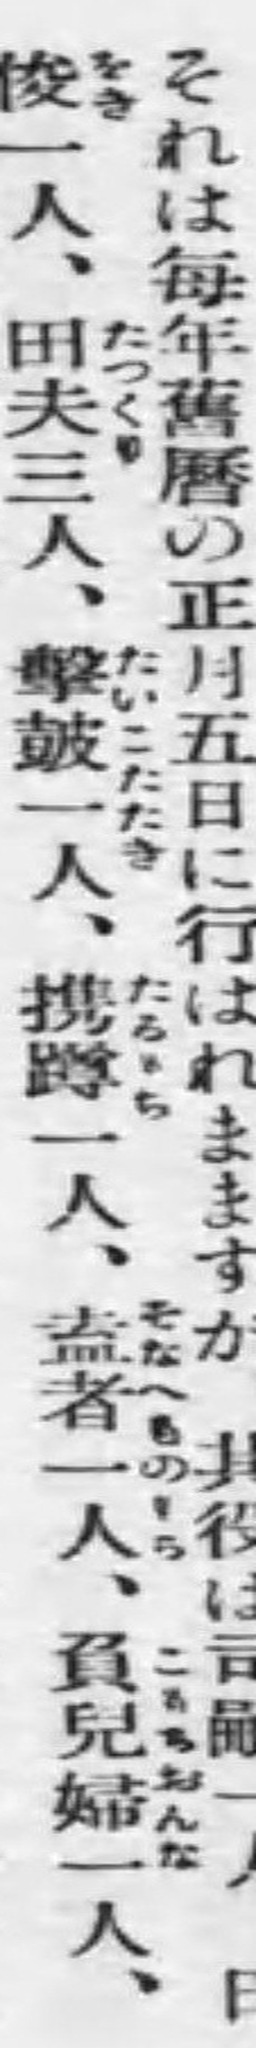俊一人、田夫三人、撃鼓一人、携蹲一人、盍者一人、負児婦一人、
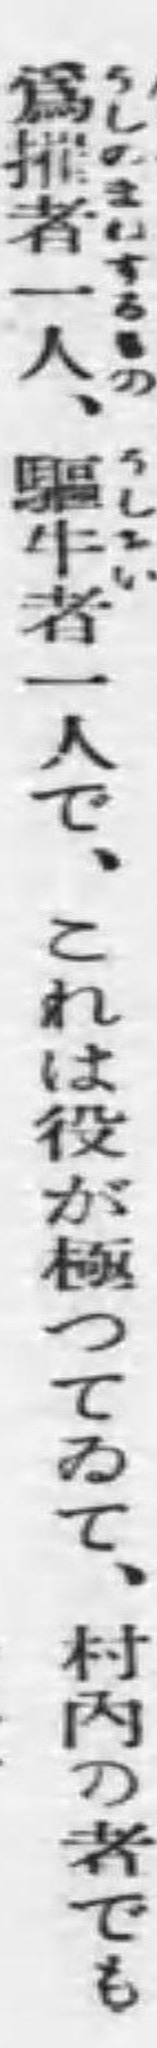為摧者一人、駆牛者一人で、これは役が極つてゐて、村内の者でも
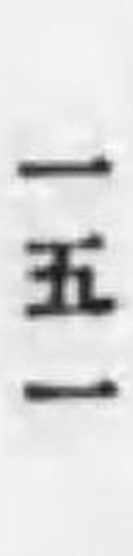一五一

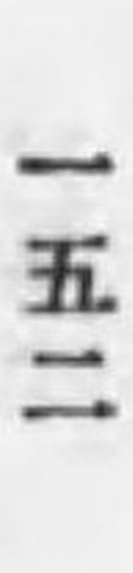一五二
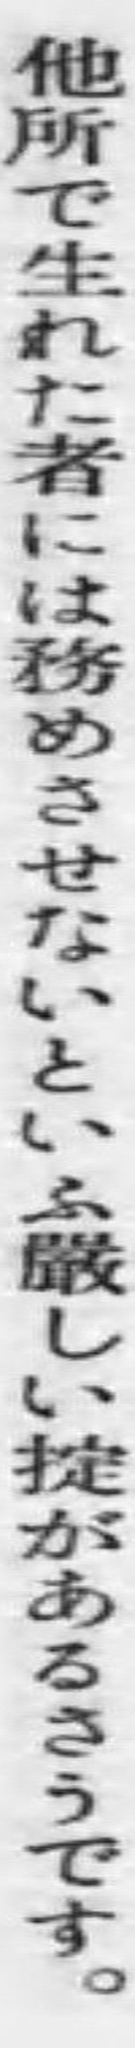他所で生れた者には務めさせないといふ厳しい掟があるさうです。
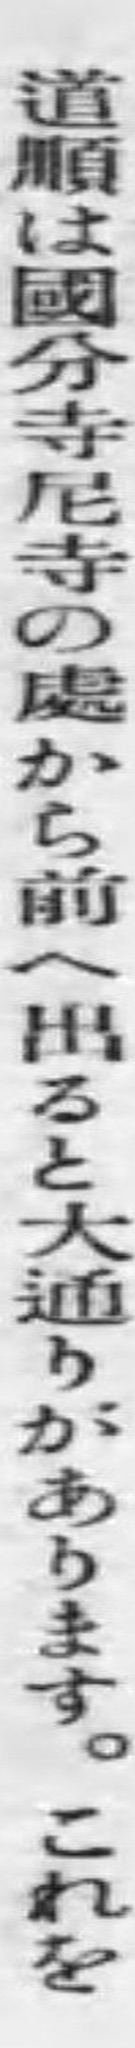道順は国分寺尼寺の処から前へ出ると大通りがあります。これを
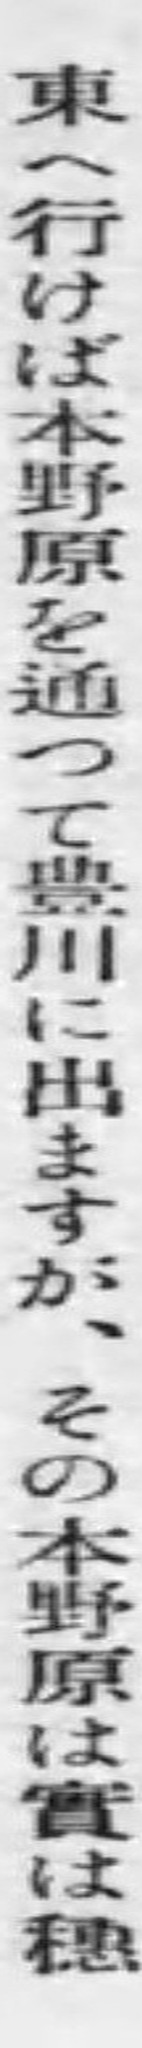東へ行けば本野原を通つて豊川に出ますが、その本野原は実は穂
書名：東三河道中記 : 豊橋市及其附近案内
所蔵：国立国会図書館 National Diet Library, JAPAN
